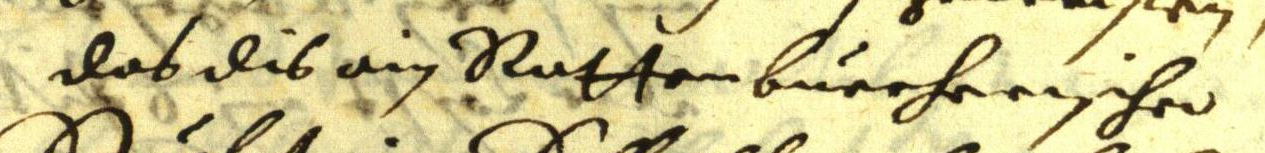das dis ain Rottenbūecherischer
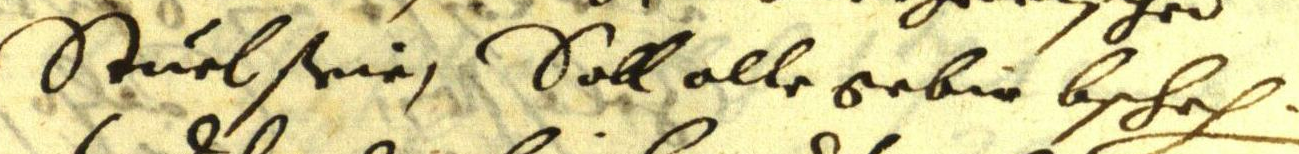Stūel seie, Soll alle gebir bscheh
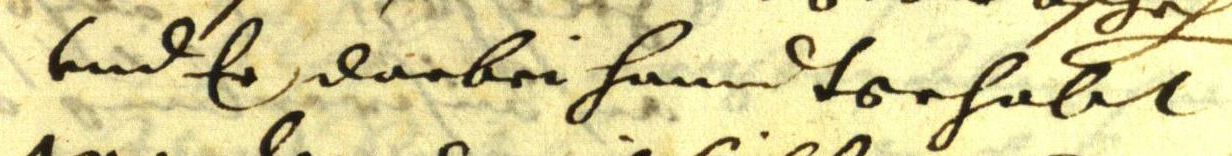vnd Er darbei hanndtgehabt
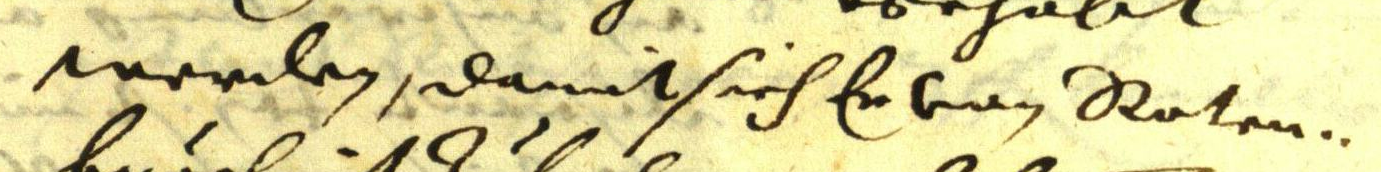werden, damit sich Er von Roten¬
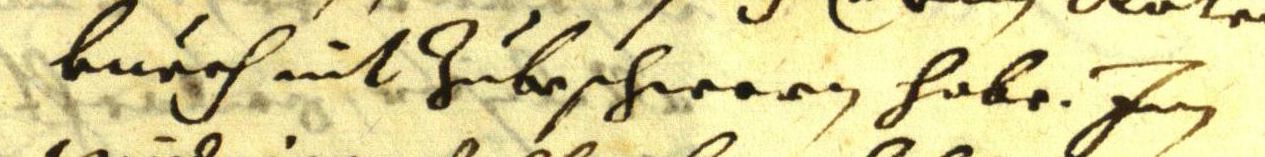būech nit Zūbeschwern habe. Im
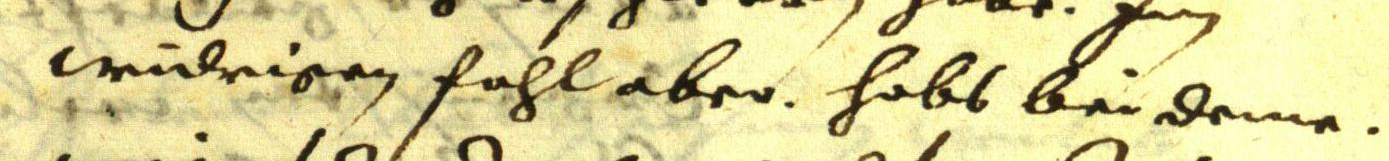widrigen fahl aber. habs bei deme.
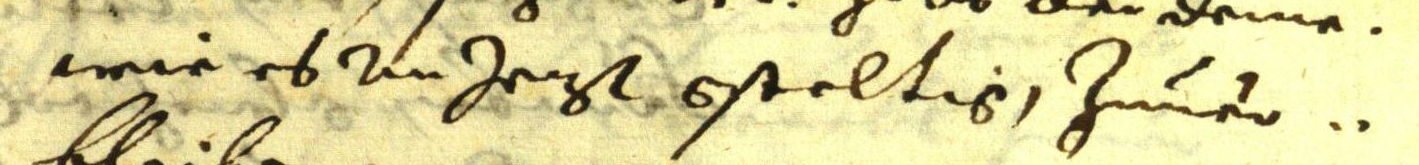wie es An Jezt gsteltig, Zūuēr¬
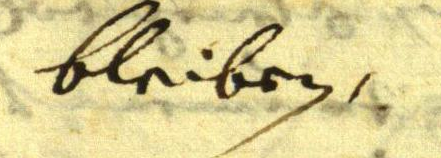bleiben,
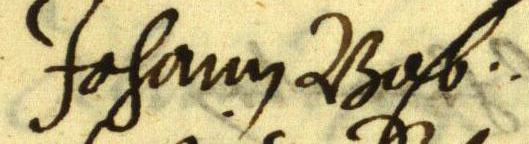Johann Bab¬
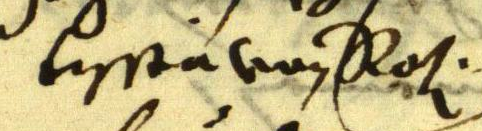tissta von Rot¬
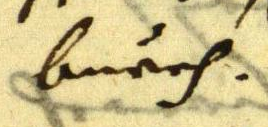būech.
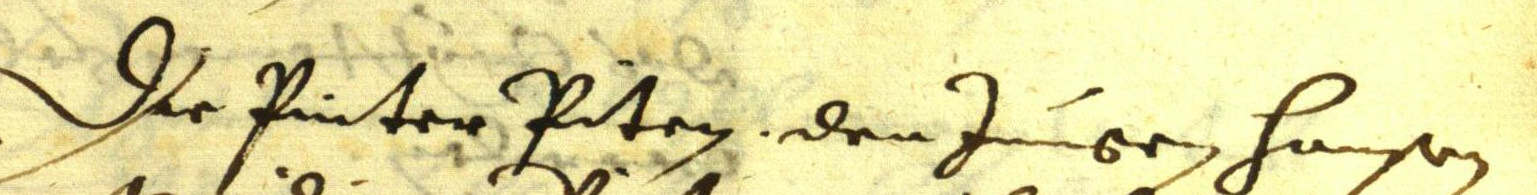Die Pinter Piten. den Jūngen hansen
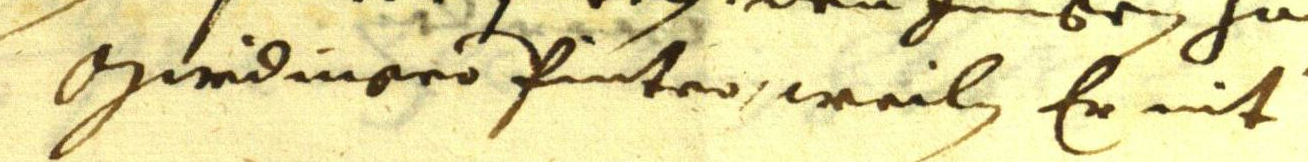Mirdinger Pinter, weiln Er nit
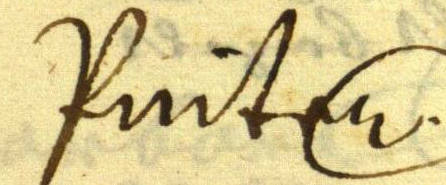Pinter.
